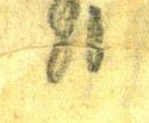80
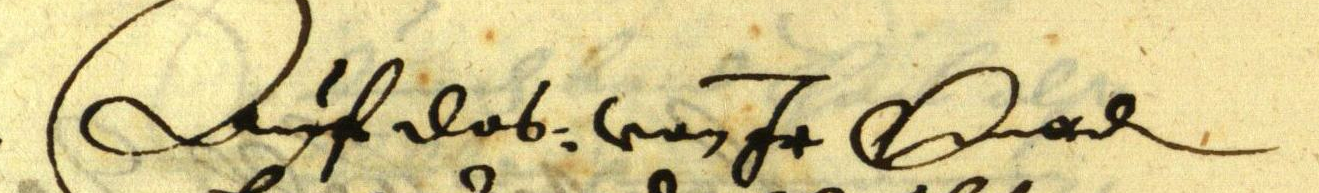Aūf das: von Ir Gnad
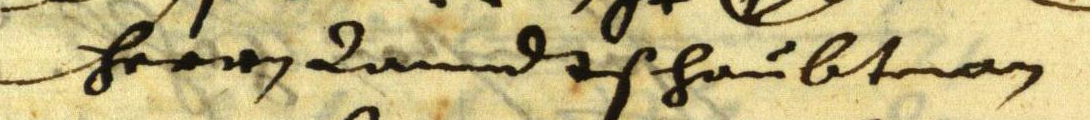herrn Lanndtshaūbtman
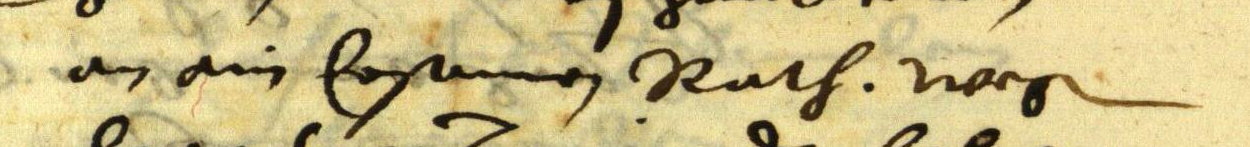an ain Ersamen Rath. weg
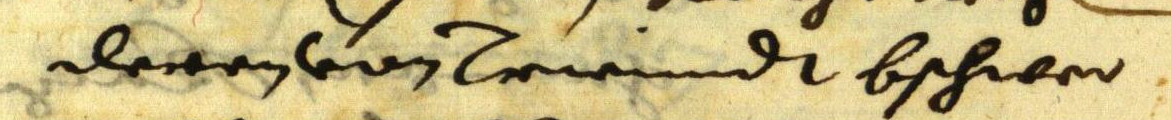deren von Trienndt bschwer
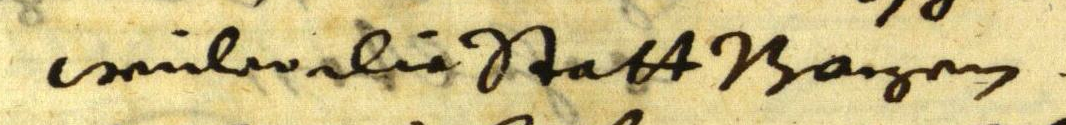wider die Statt Bozen.
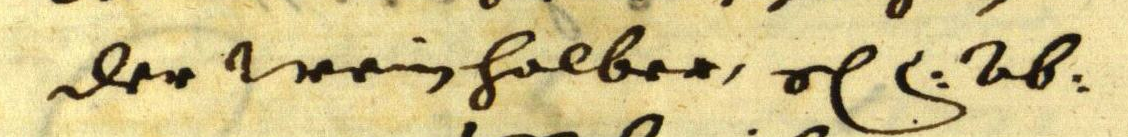der Wein halber, g: ab¬
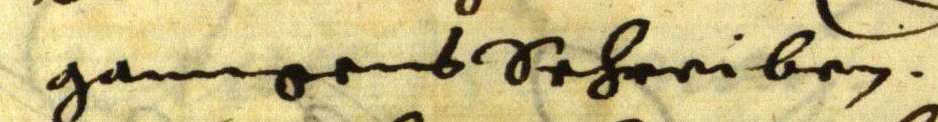ganngens Schreiben.
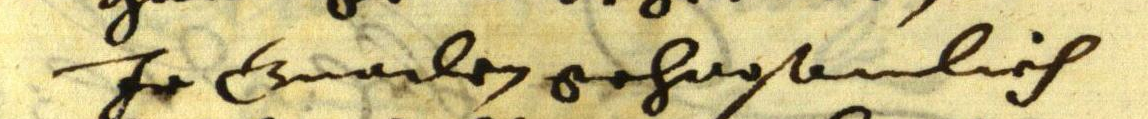Ir Gnaden gehorsamlich
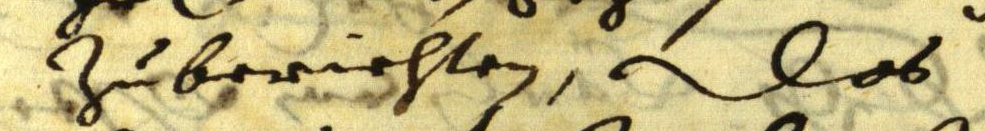Zū berichten, Das
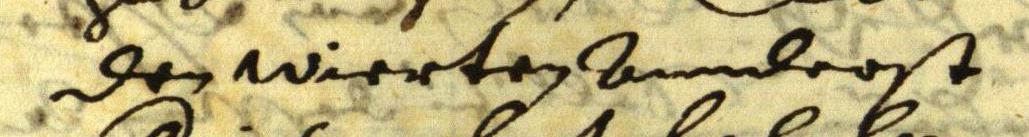den Wierten Annderst
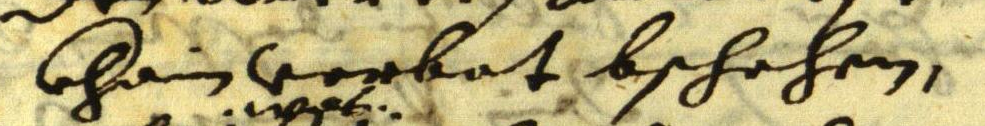khain verbot bschehen,
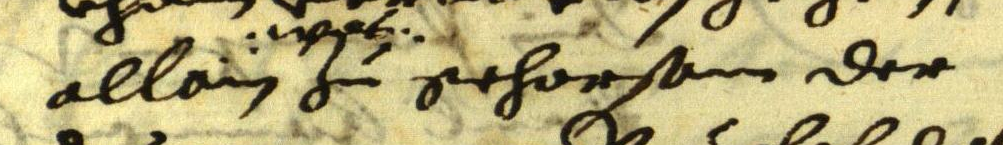allain was Zū gehorsam der
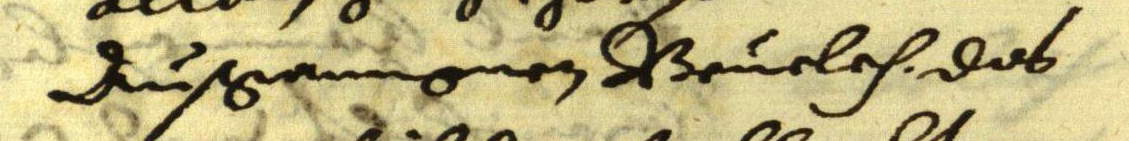Aūsganngnen Beūelch. das
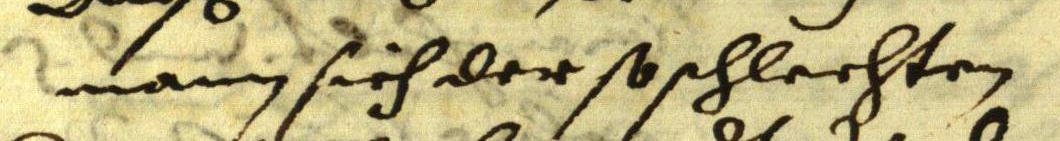mann sich der so schlechten
